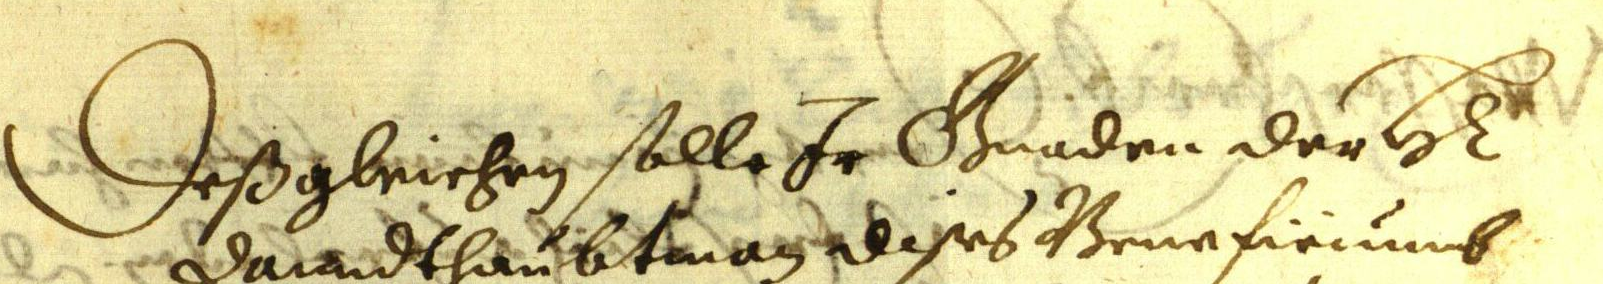Deßgleichen solle Ir Gnaden der H
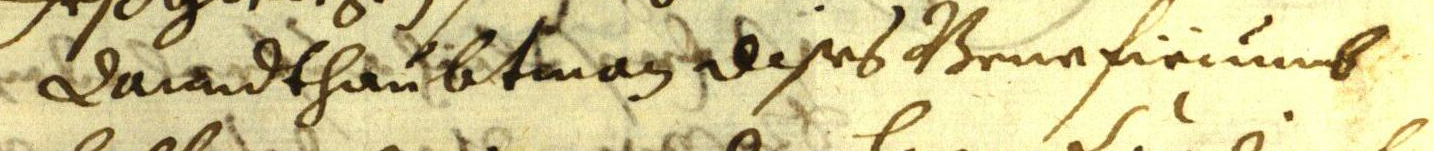Lanndthaūbtman dises Beneficiūmb
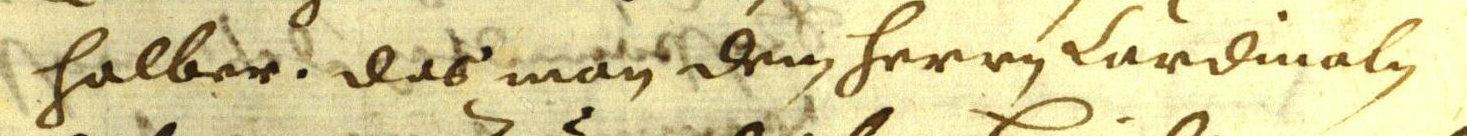halber. das man dem herrn Cardinaln
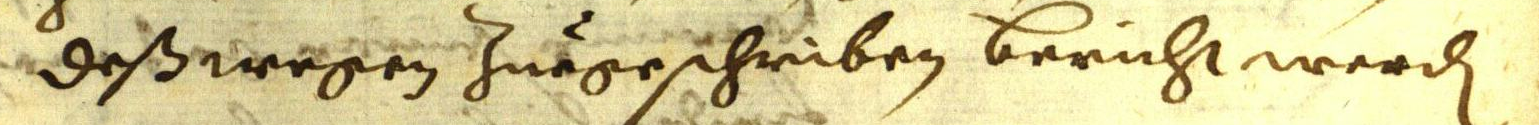deßwegen Zūgeschriben bericht werd
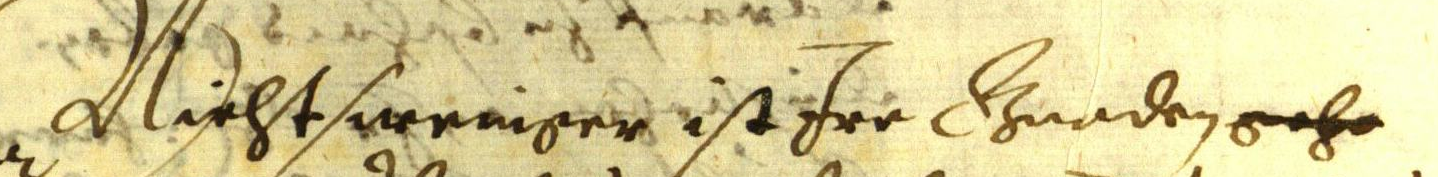Nichts weniger ist Ire Gnaden geho
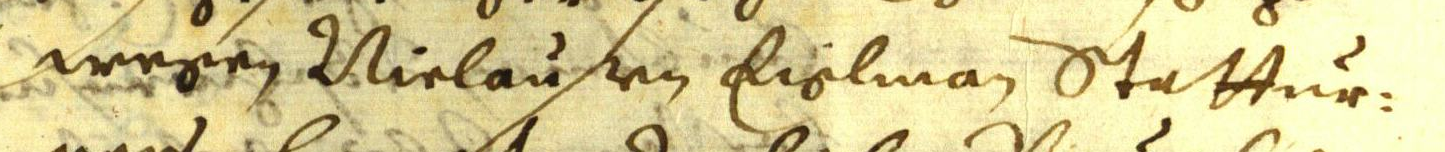wegen Niclaūsen Eiglman Stattūr¬
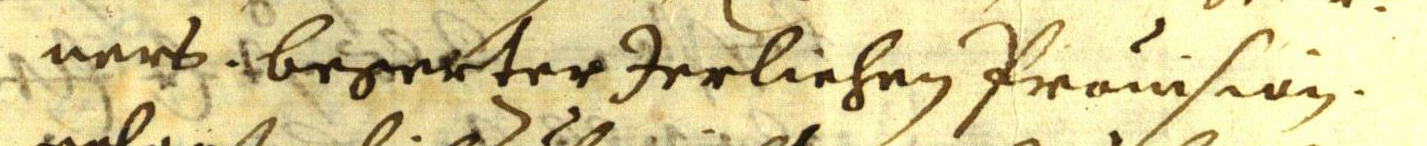ners. begerter Jerlichen Proūision.
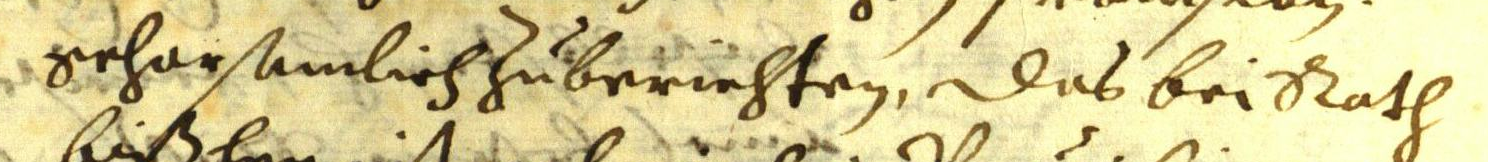gehorsamlich Zū berichten, das bei Rath
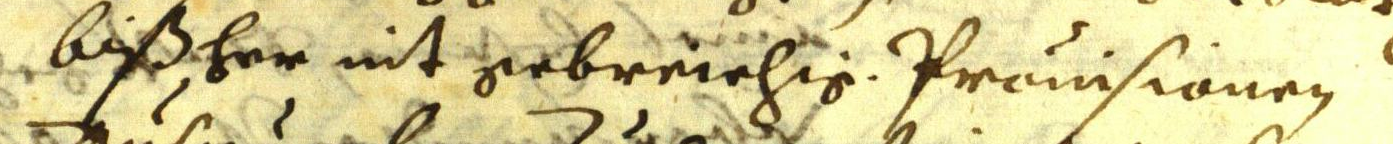bissher nit gebreichig. Proūisionen
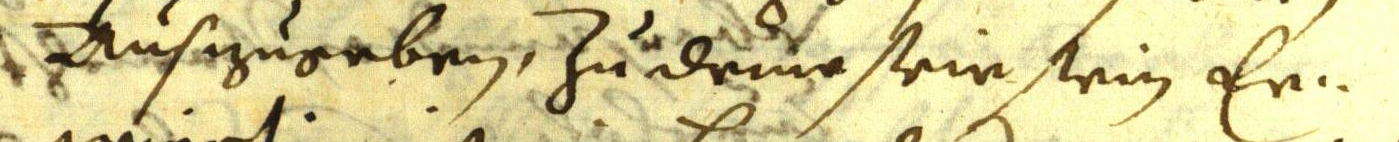Aūszūgeben, Zū deme seie sein Ee¬
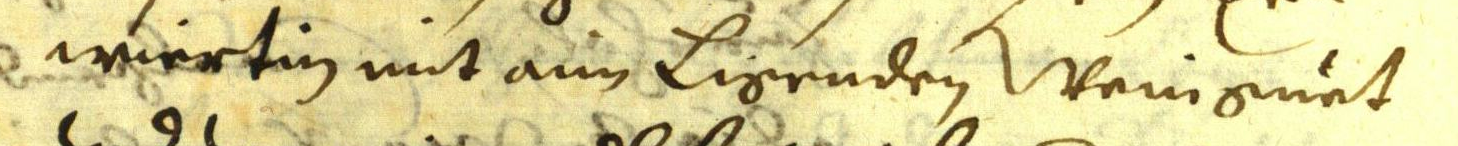wirtin mit aim Ligenden Weingūet
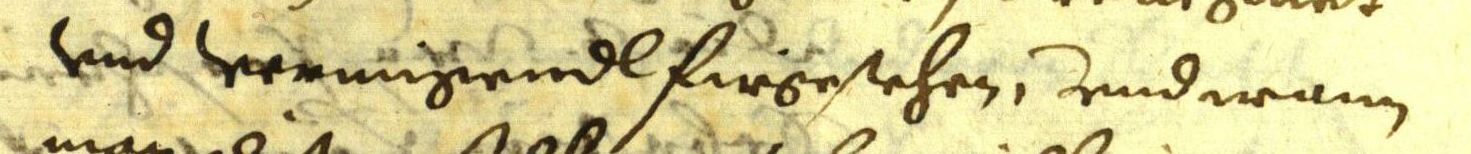vnd vermigend firgesehen, ūnnd wann
